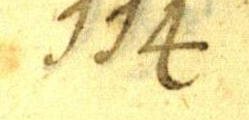114
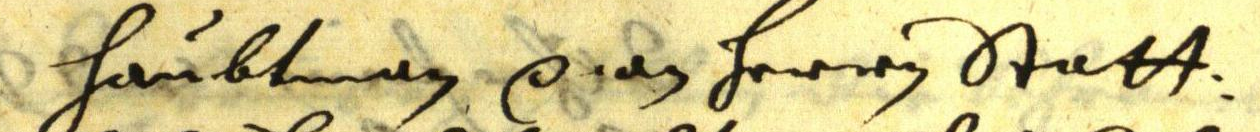haūbtman etc. herrn Statt¬
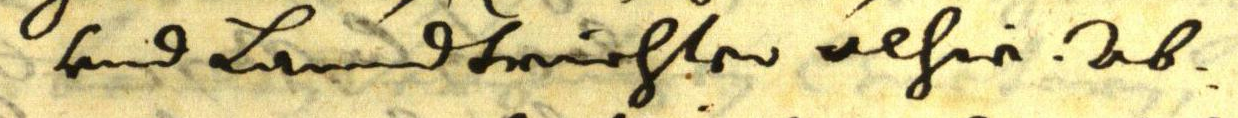vnd Lanndtrichter alhie. Ab¬
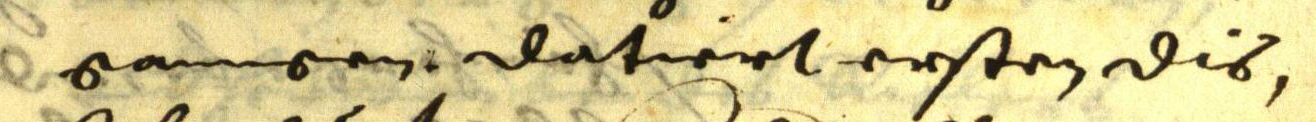ganngen. datiert ersten dis,
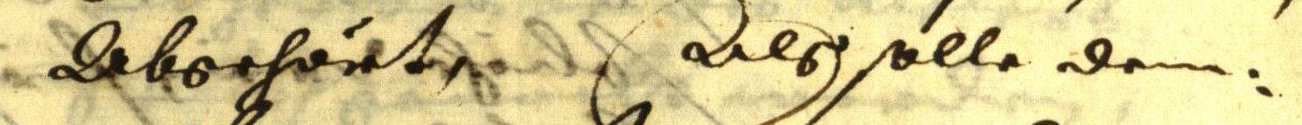Abgehört, Als solle dem¬
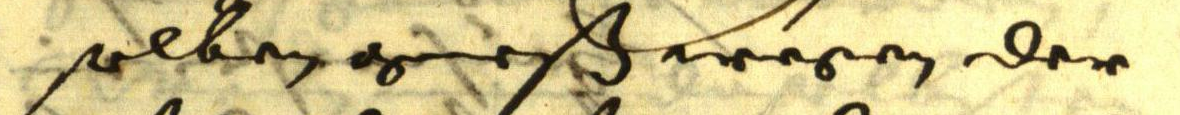selben gemeß wegen der
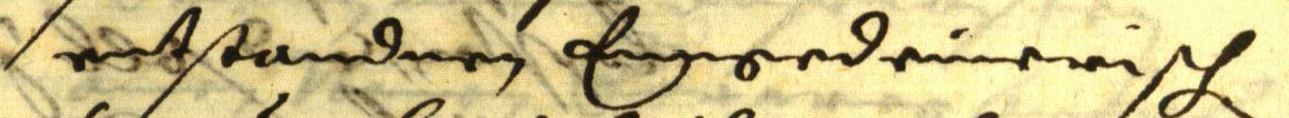entstandnen Enngedeinerisch
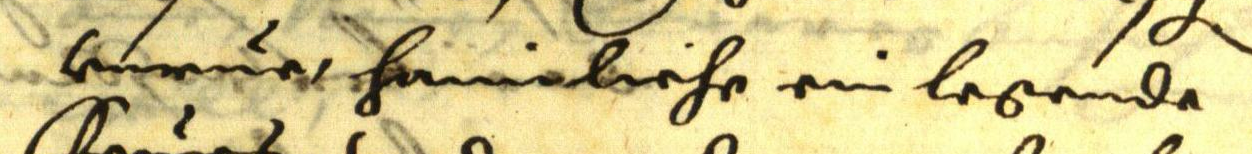vnrūe haimliche ein legende
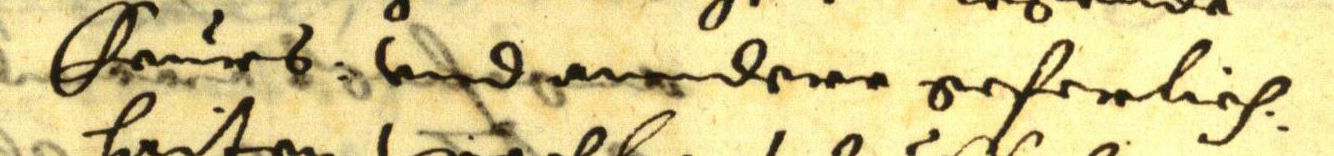Feūrs: vnd anndere geferlich¬
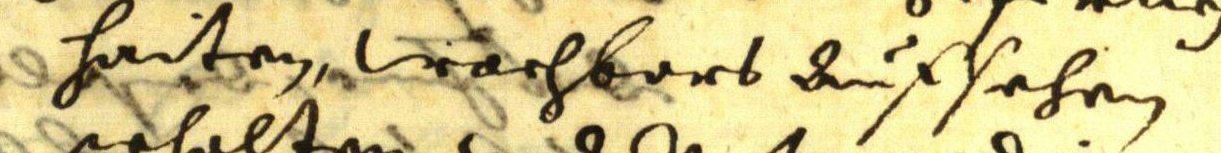haiten, wachbars Aūfsehen
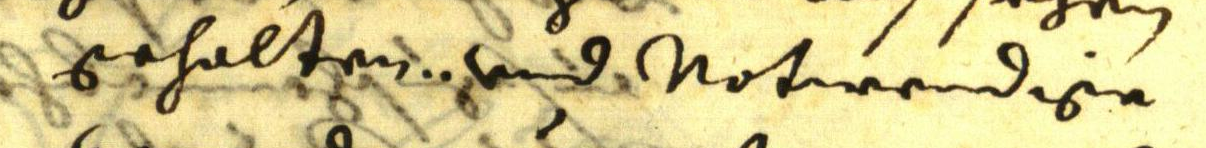gehalten: vnd Notwendige
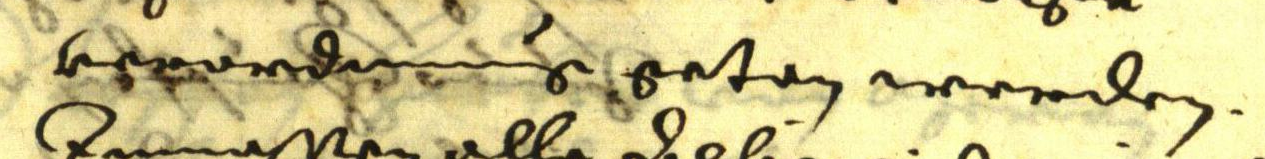verordnūng getan werden.
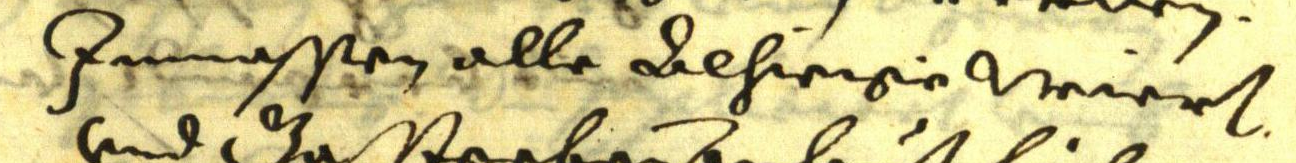Inmassen alle Alhieige Wiert
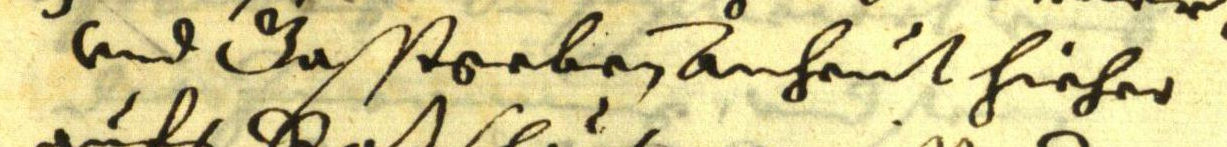vnd Gasstgeben Anheūt hieher
